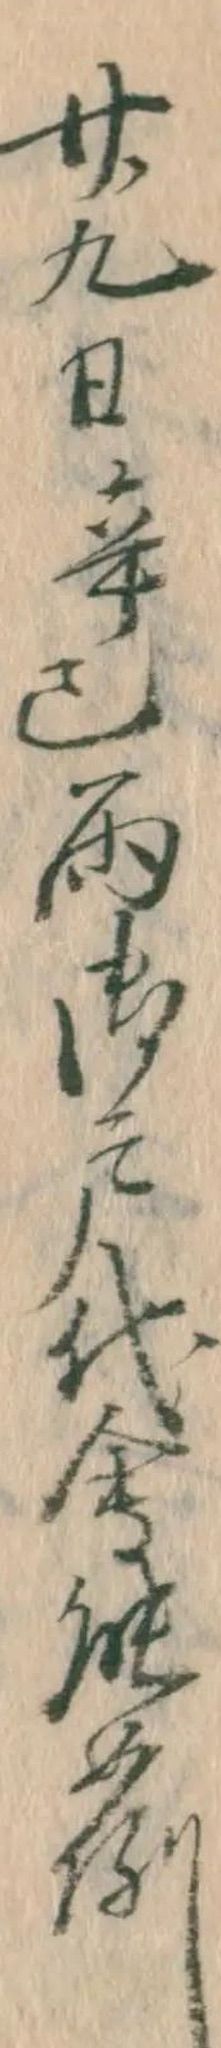廿九日辛巳雨御戸代會能如例
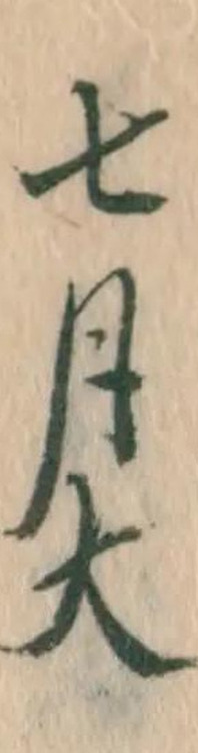七月大
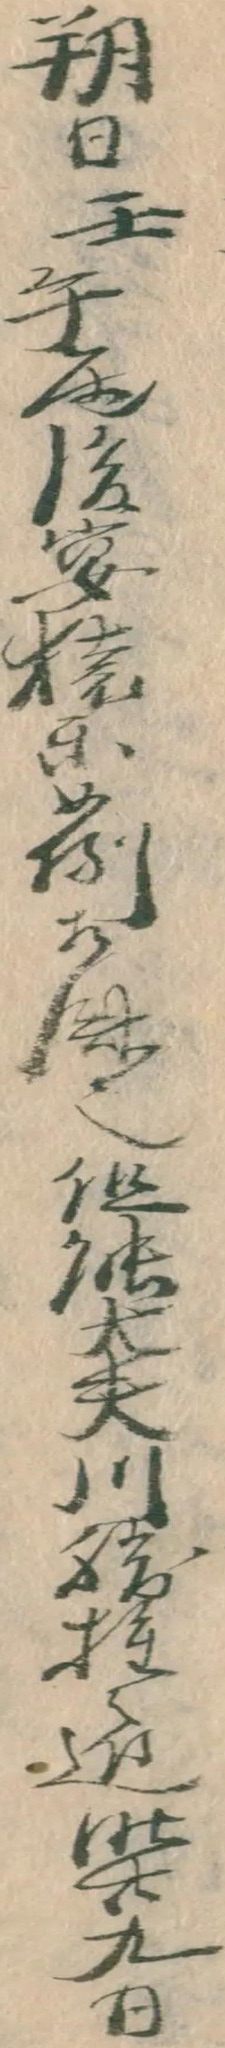朔日壬午雨後宴猿等如例相済也但能大夫川勝権之進昨廿九日
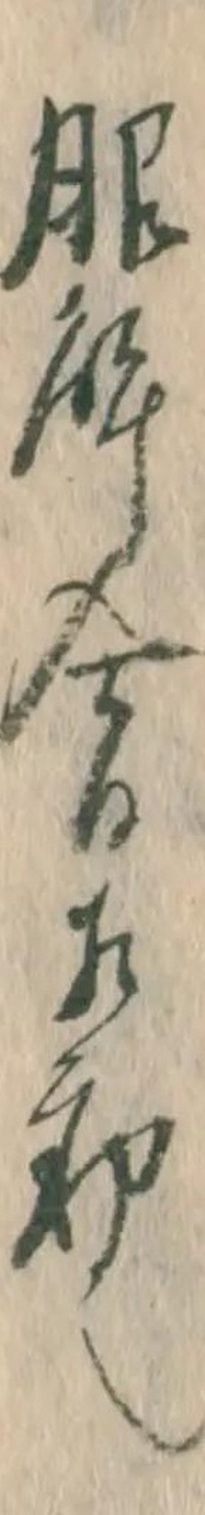服解今日相勤也
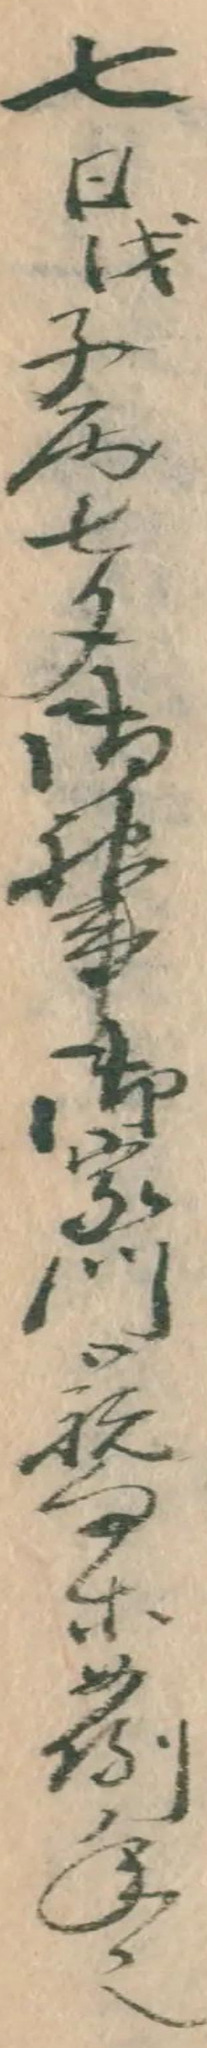七日戊子雨七夕御神事御家門御祝句等如例年也

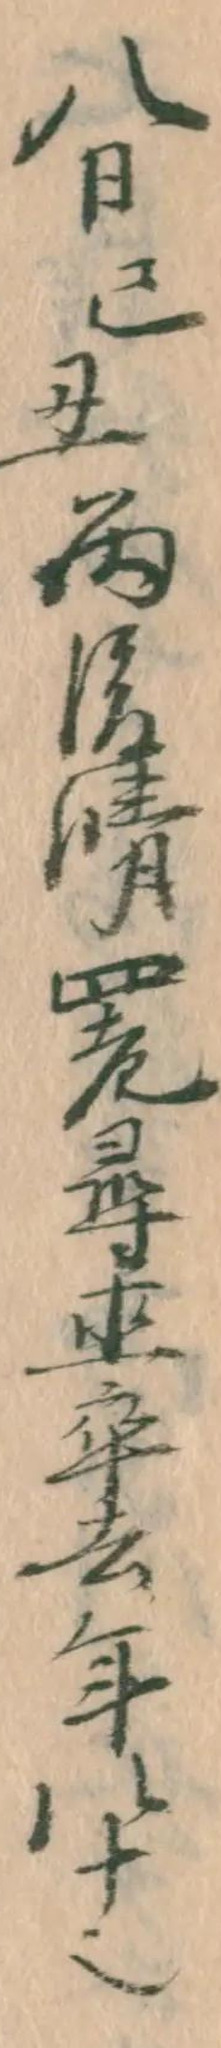八日己丑雨後晴四老尋直卒去年八十也
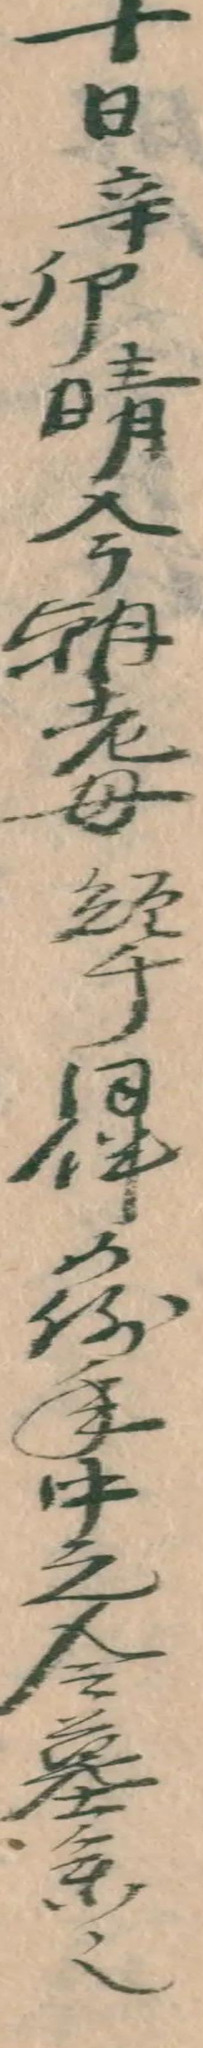十日辛卯晴今朝老母短千同伴如例年中元令墓参也
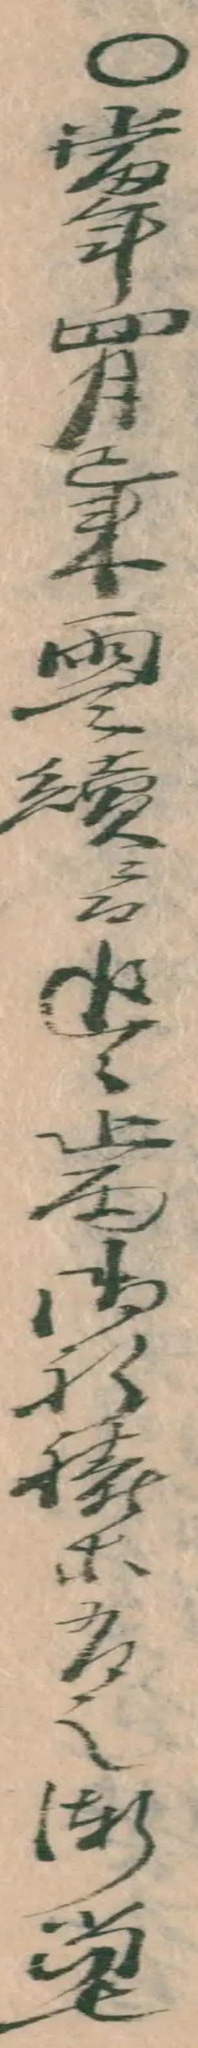〇當年四月已来雨可續ニ而追々止雨御祈祷等有之漸當七
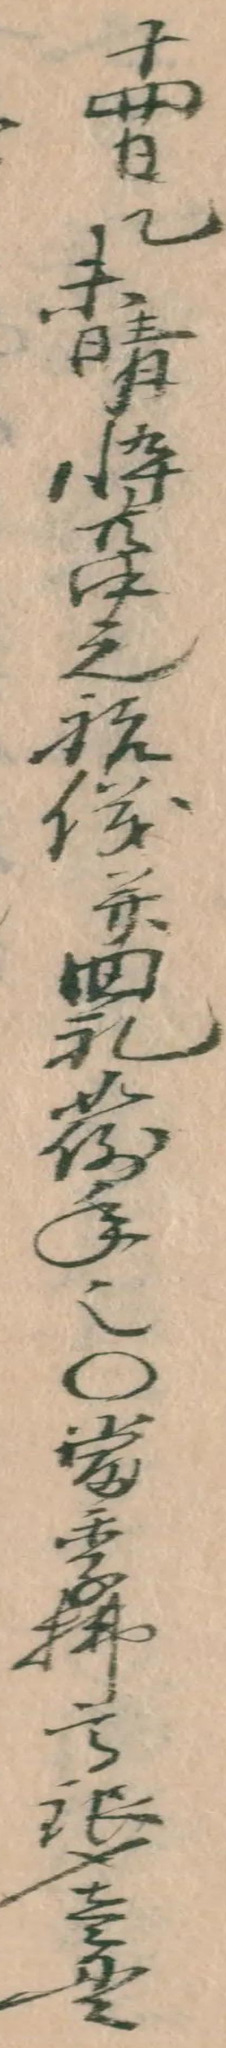十四日乙未忰共御元祝儀并回礼如例年也○當季払高銀〆壱貫
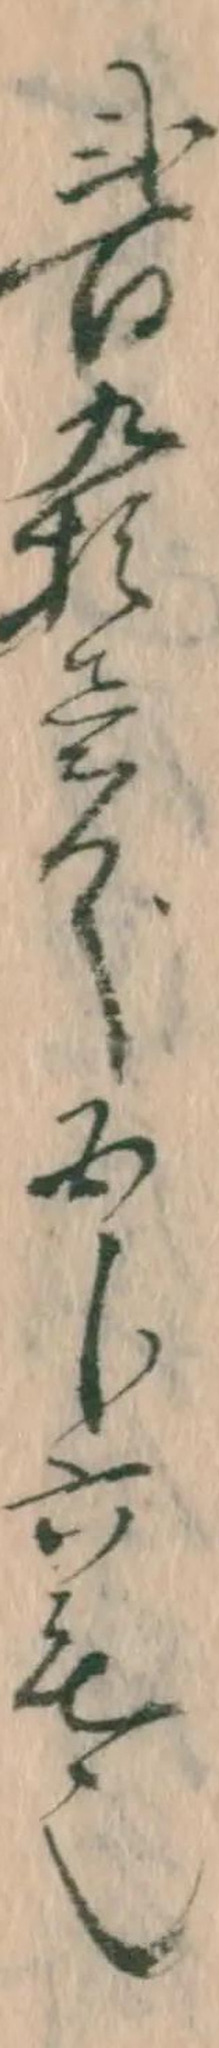弐百九拾壱匁五分六毛也
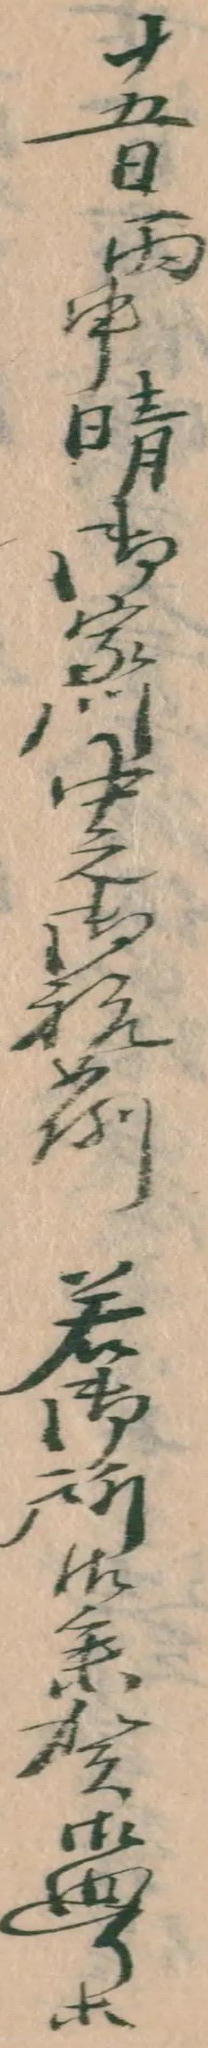十五日丙申晴御家門中之御祝如例若御所御参賀御廻リ等
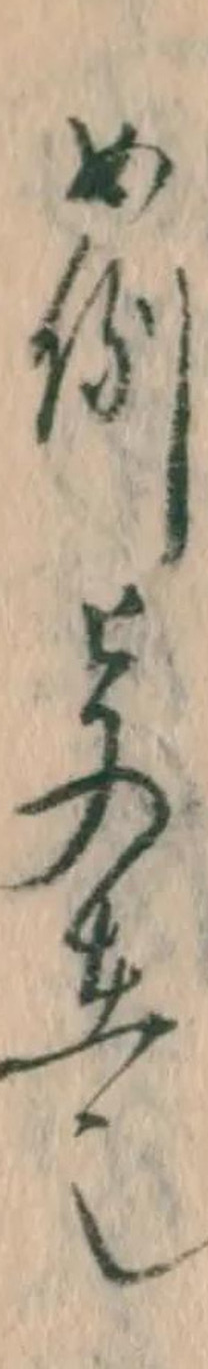如例被為在之
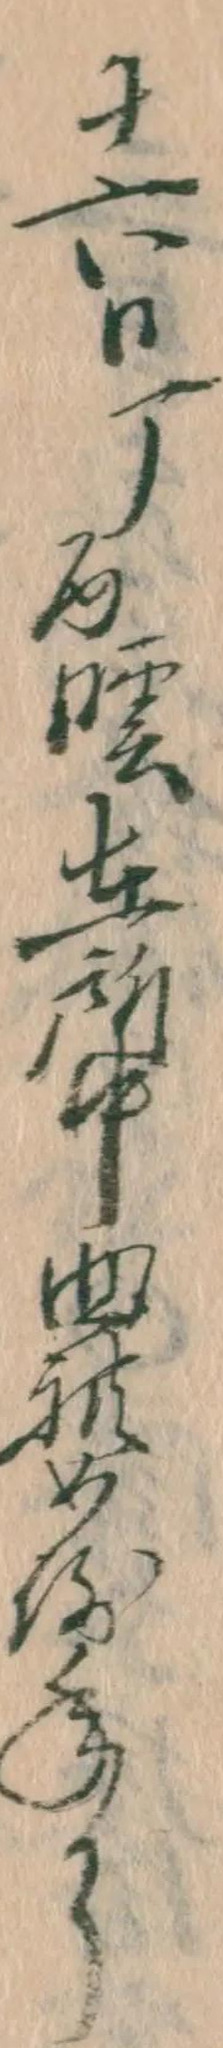十六日丁酉曇在所中回礼如例年了
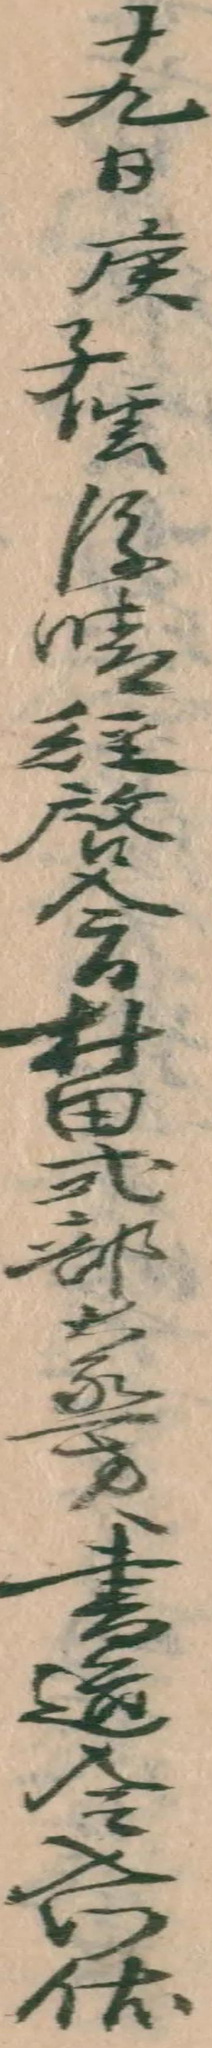十九日庚子曇後晴経啓今日村田式部大丞方へ書道令入門伏
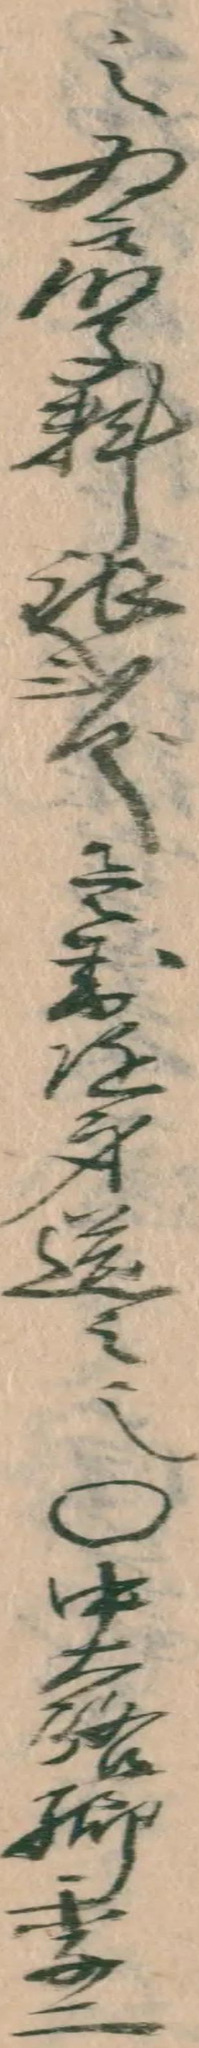之為扇子料銀弐匁壱朱随身送之也○中大路郷季二
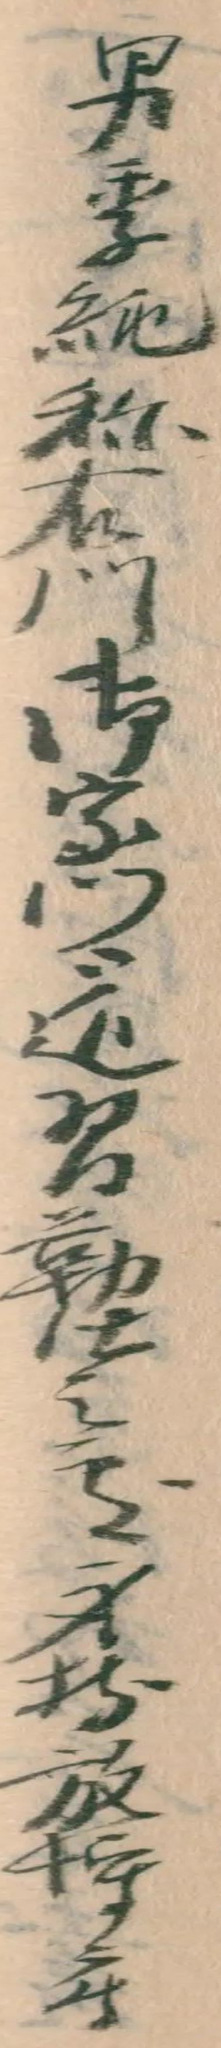昇季紀称右門御家門御近習勤仕之處身持放埒ニ付
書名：賀茂社記録. 第67冊
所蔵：国立国会図書館 National Diet Library, JAPAN
